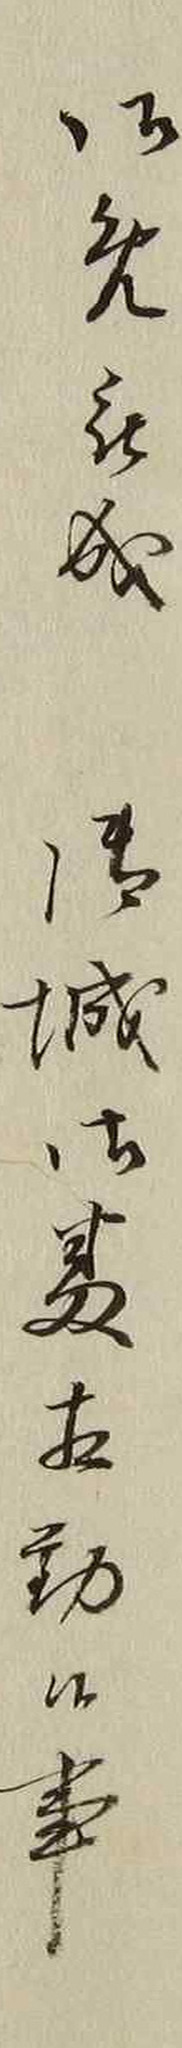御免被成御城御番相勤候事
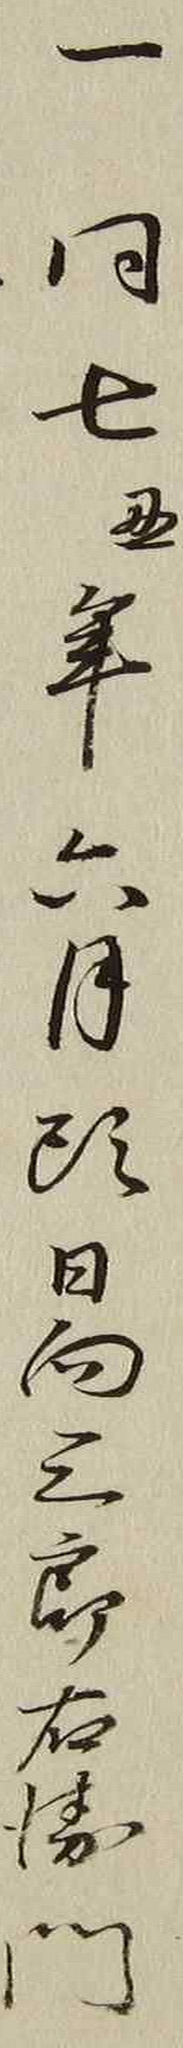一同七丑年六月頭日向三郎右衛門
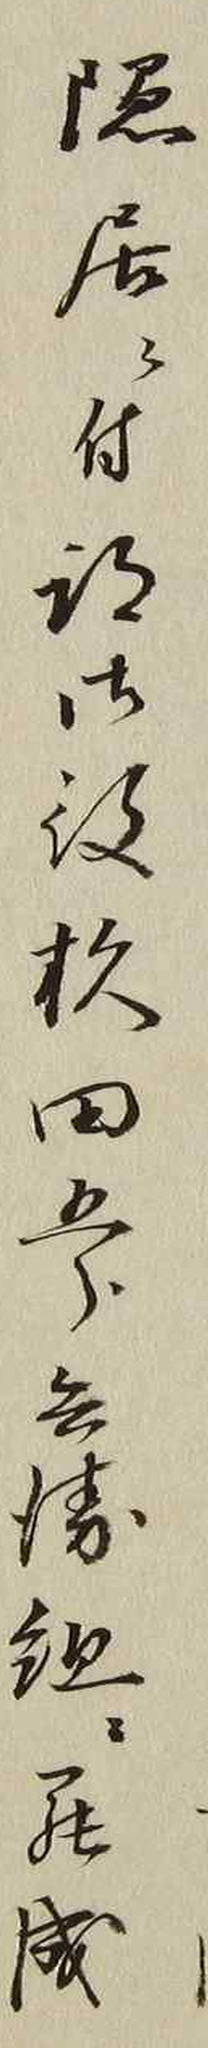隠居ニ付跡御役杉田五郎兵衛組ニ罷成
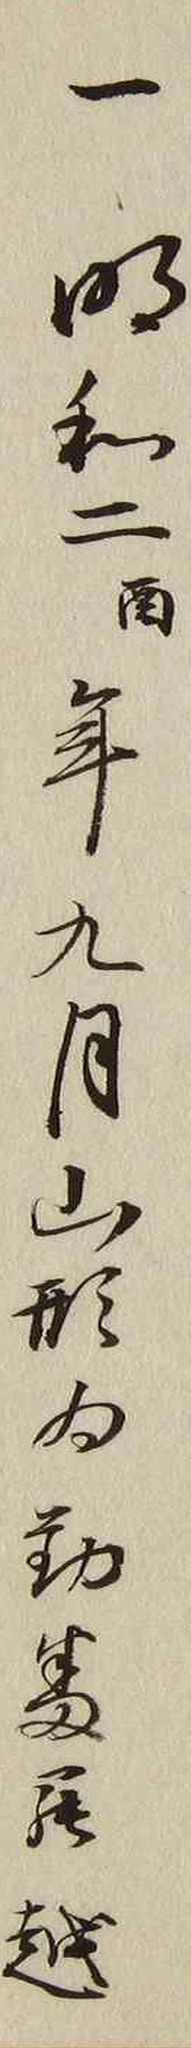一明和二酉年九月山形為勤番罷越
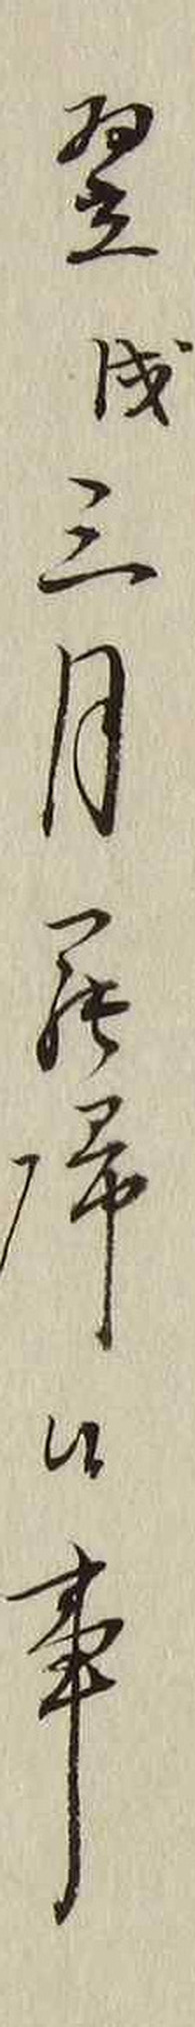翌戌三月罷帰候事
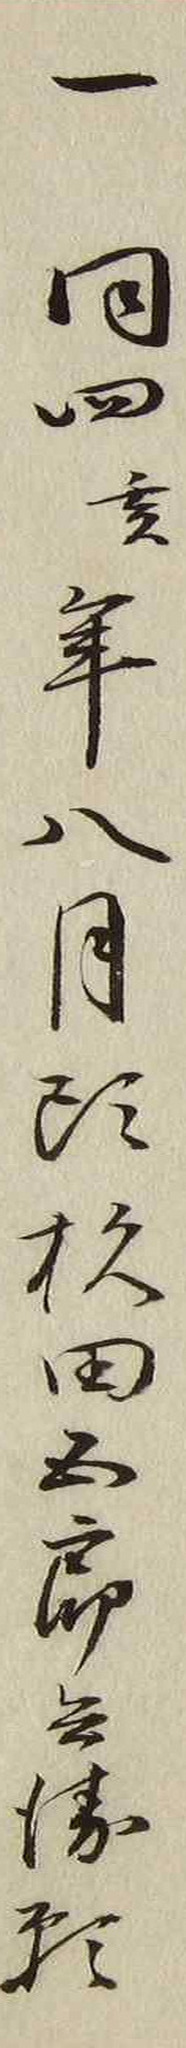一同四亥年八月頭杉田五郎兵衛願
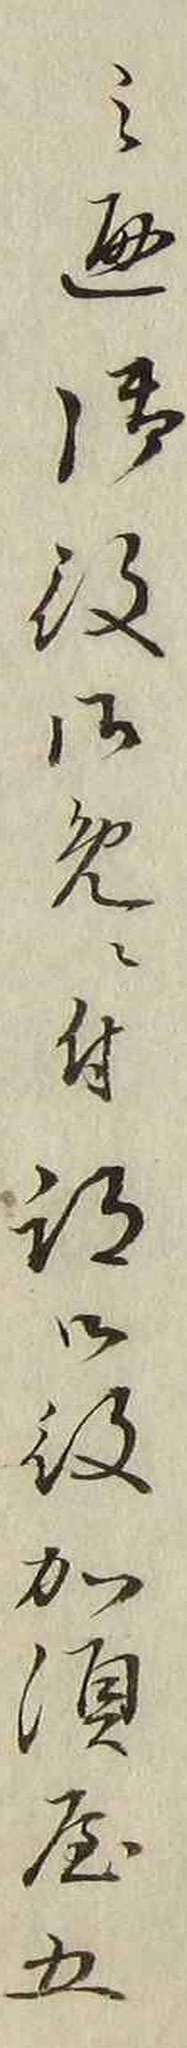之通御役御免ニ付跡御役加須屋五
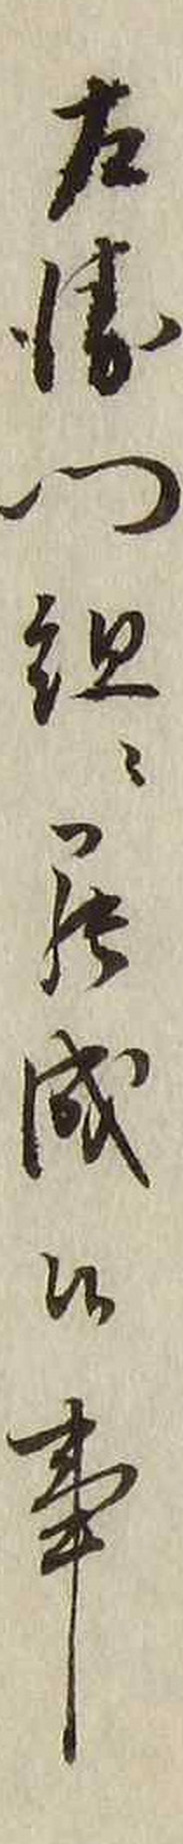左衛門組ニ罷成候事
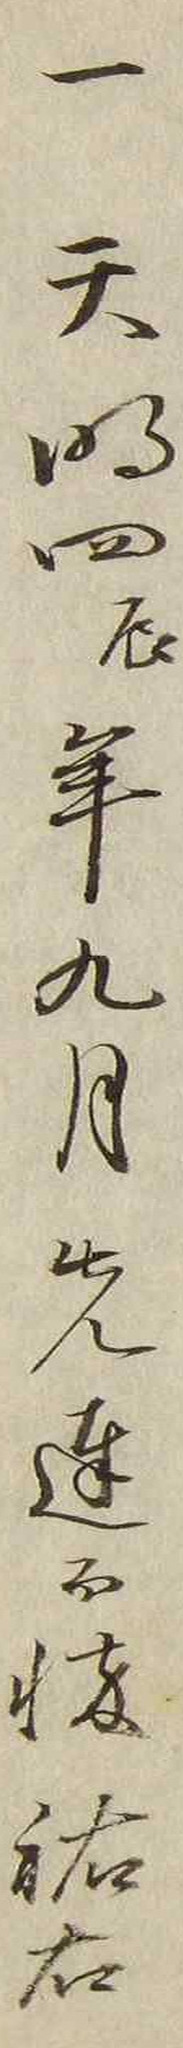一天明四辰年九月先達而悴祐右

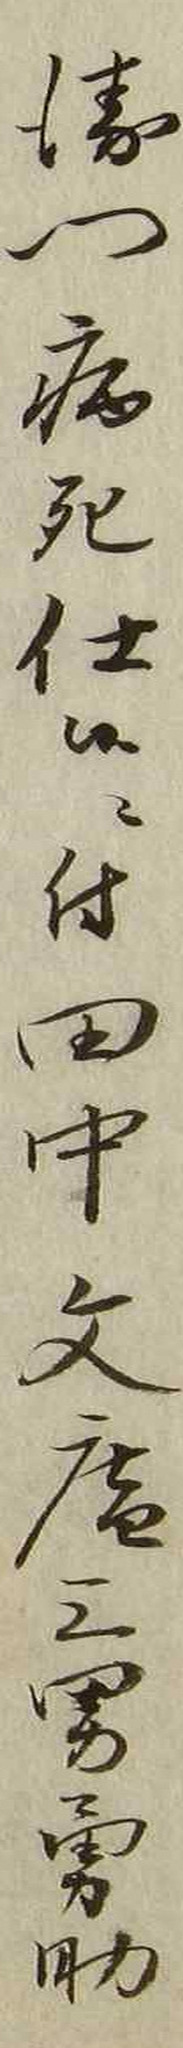衛門病死仕候ニ付田中文庵三男勇助
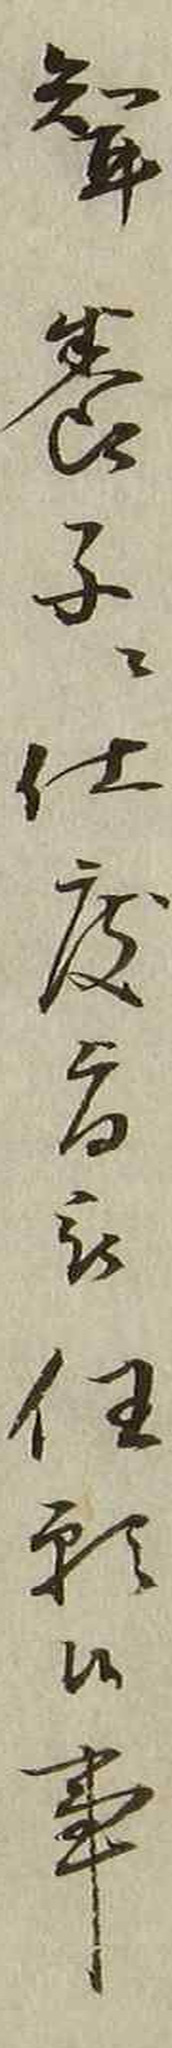聟養子ニ仕度旨被任願候事
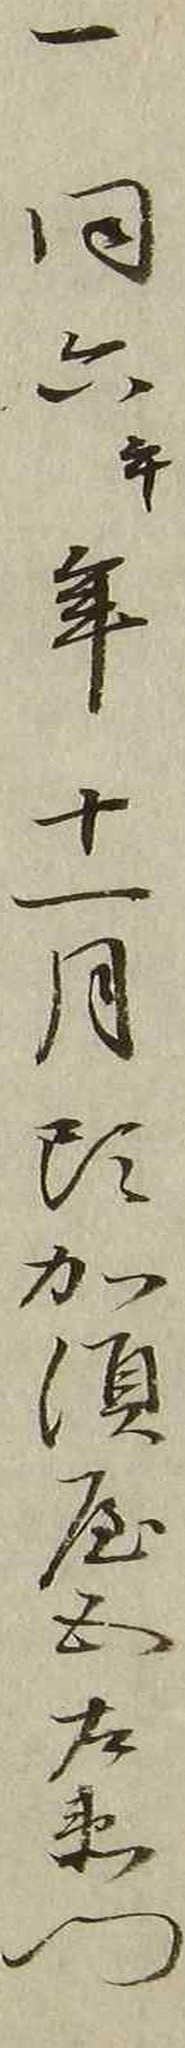一同六午年十一月頭加須屋五左衛門
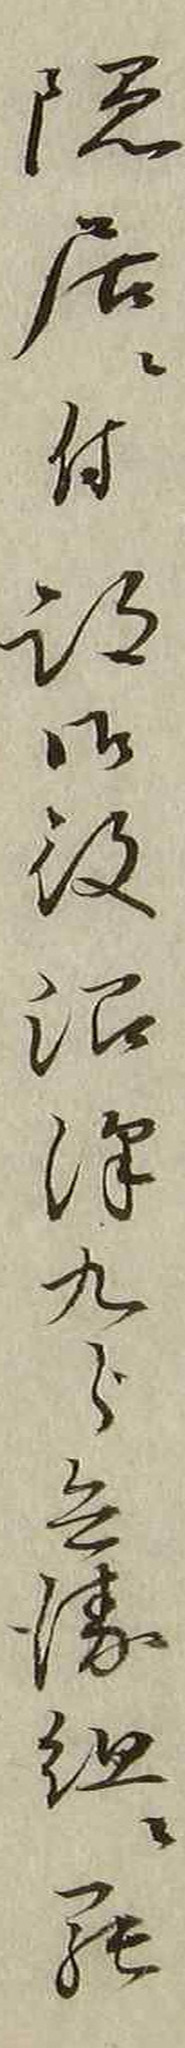隠居ニ付跡御役沼沢九郎兵衛組ニ罷
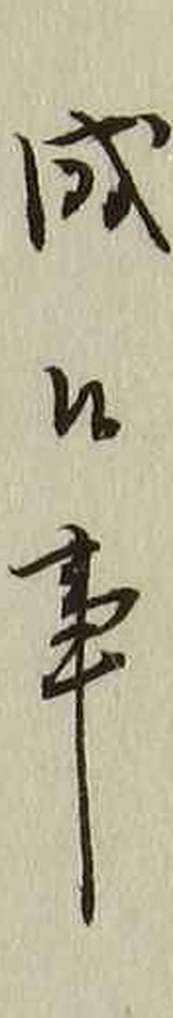成候事
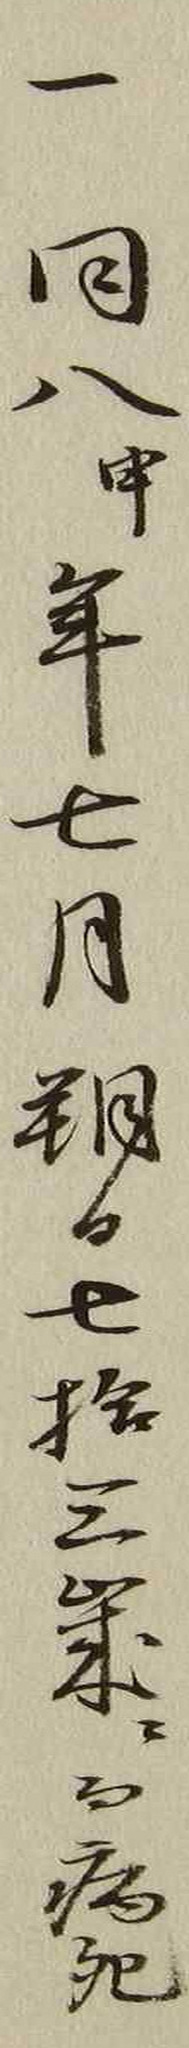一同八申年七月朔日七拾三歳ニ而病死
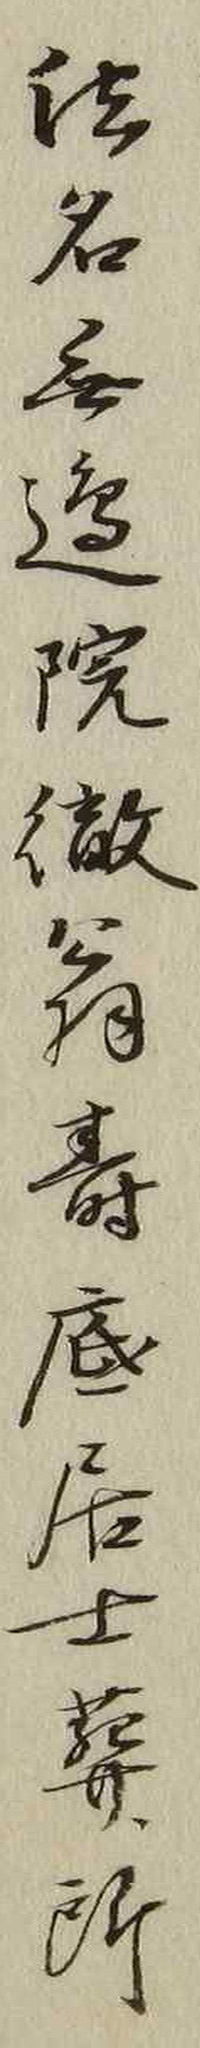法名無辺院徹翁寿底居士葬所
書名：諸士系譜　巻之22　い之部22
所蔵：会津若松市立会津図書館
